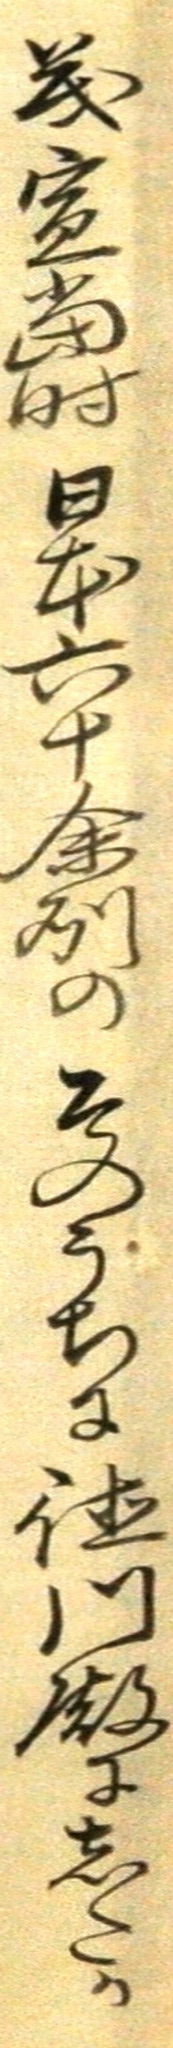義宣当時日本六十余州のそのうちに徳川殿にしたか
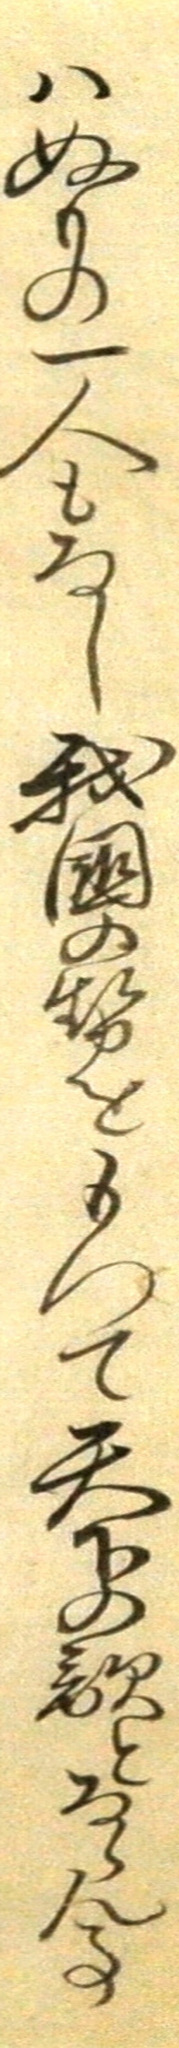はぬもの一人もなし我国の勢をもつて天下の敵とならん事
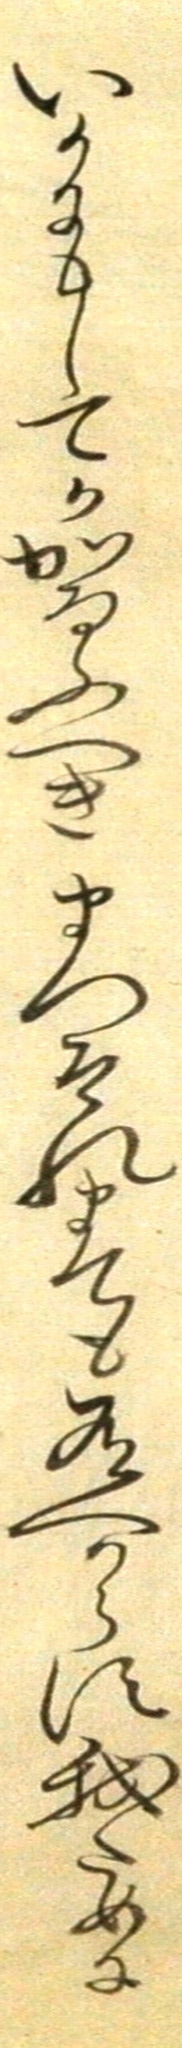いかにもしてかかなふへきまつそれまても有へからす我ために
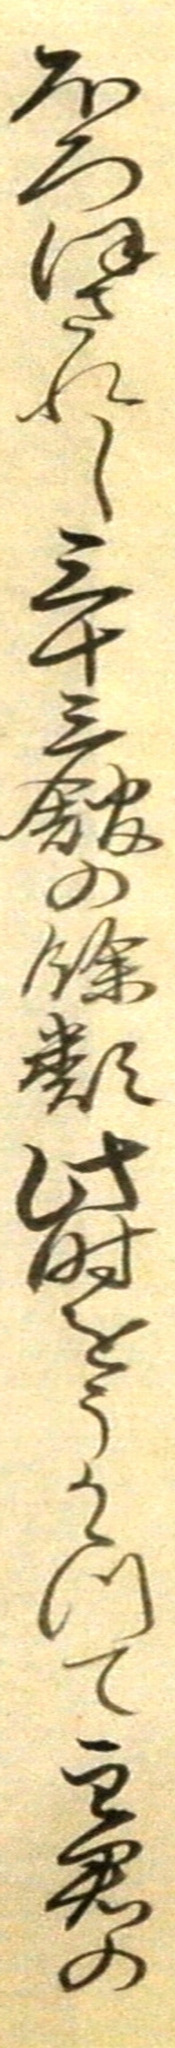ほろほされし三十三館の余類此時をうかゝつて主君の
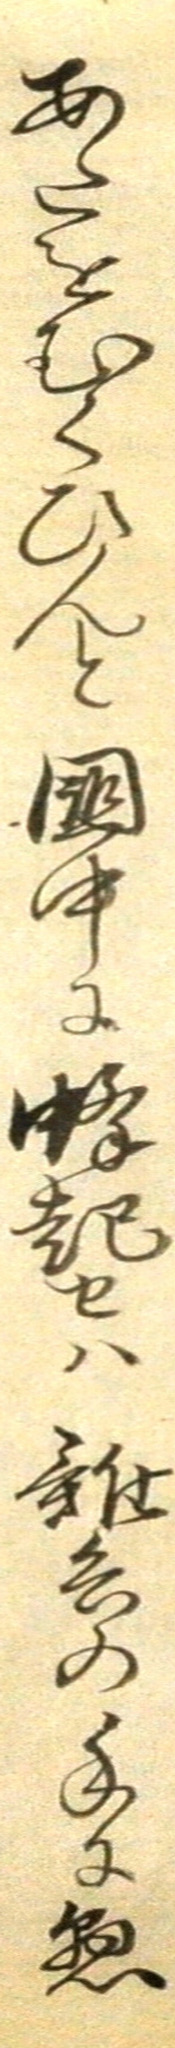あたをむくひんと国中に蜂起せは雑兵の手に懸
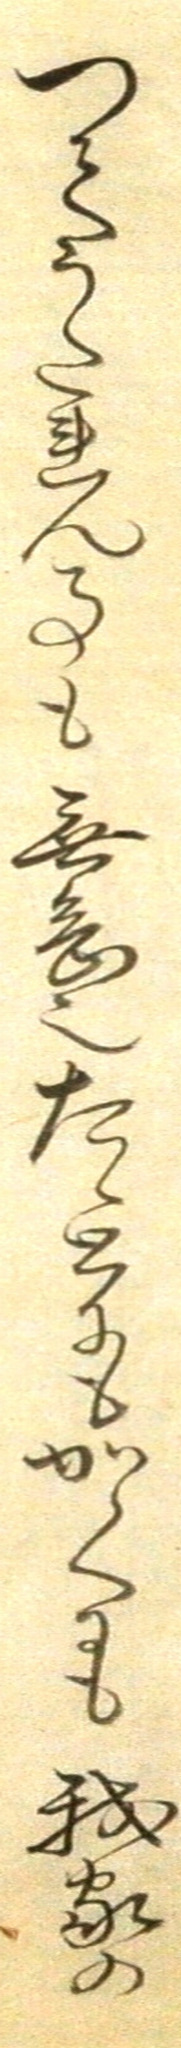つてうたれん事も無念也たゝとにもかくにも我家の
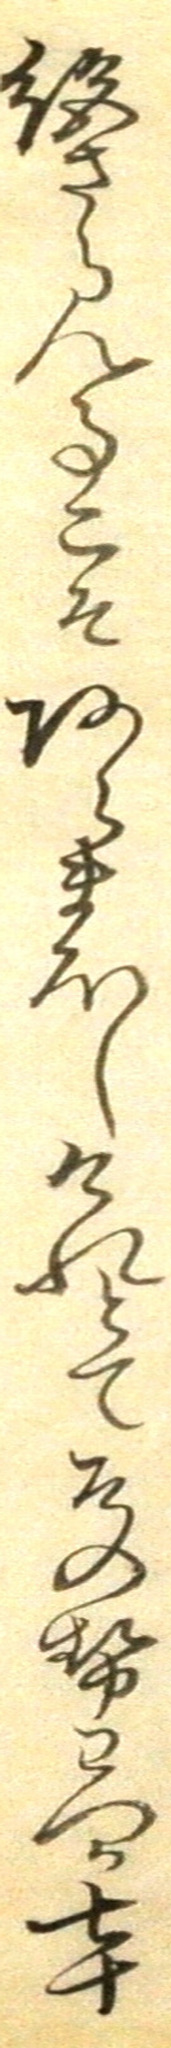絶さらん事こそあらまほしけれとてその勢わつか七十
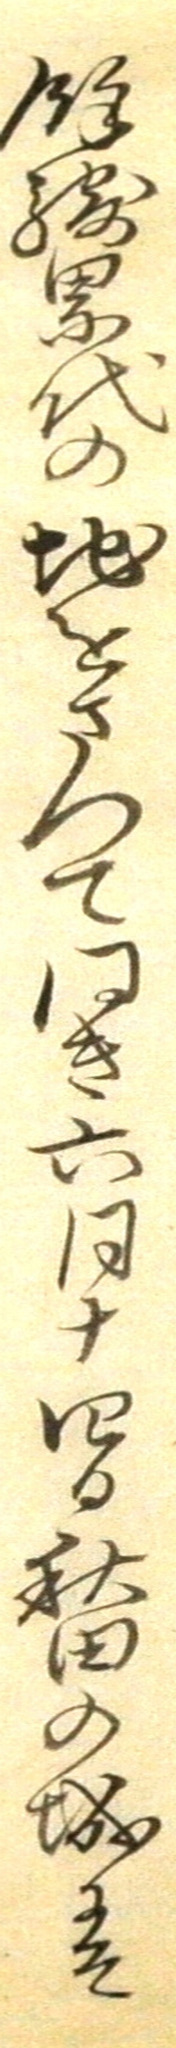余騎累代の地をさつて同き六月十四日秋田の城にそ
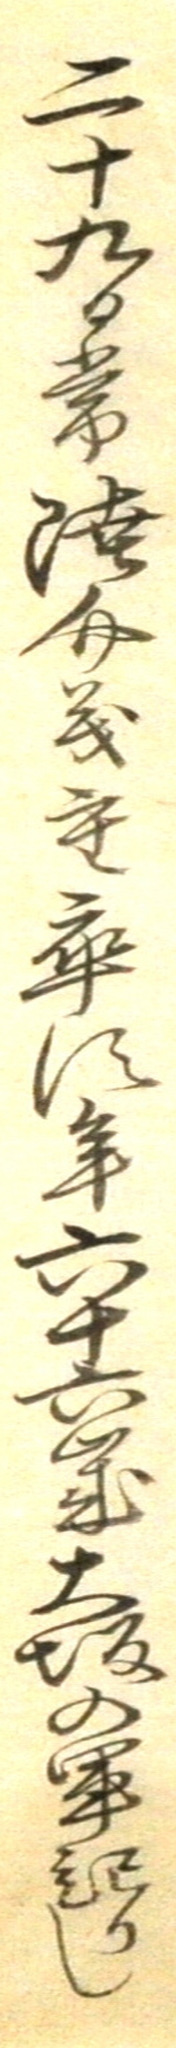二十九日常陸介義重卒す年六十六歳大坂の軍起りし
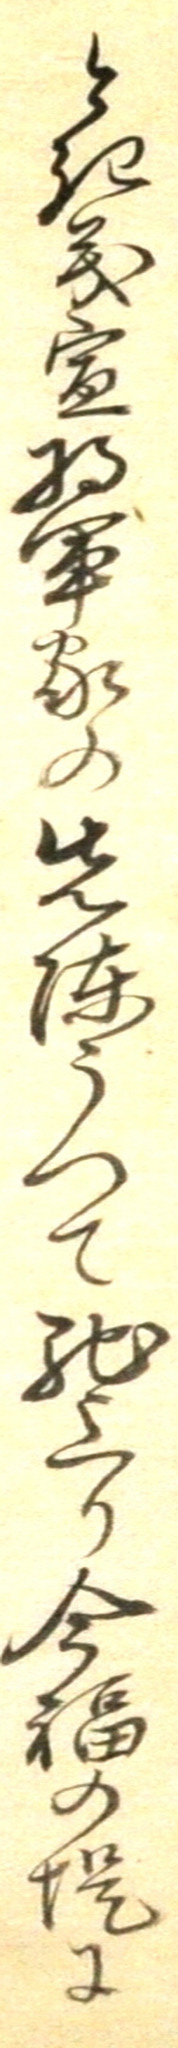とき義宣将軍家の先陣うつて馳上り今福の堤に
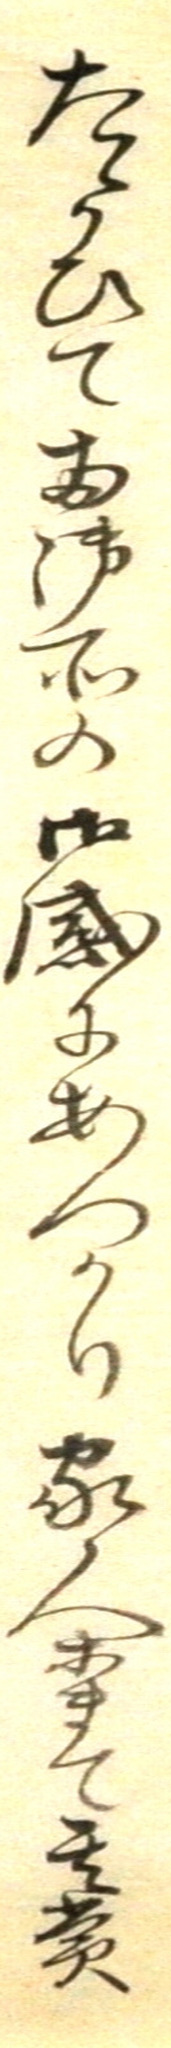たゝかひて両御所の御感にあつかり家人等まて其賞
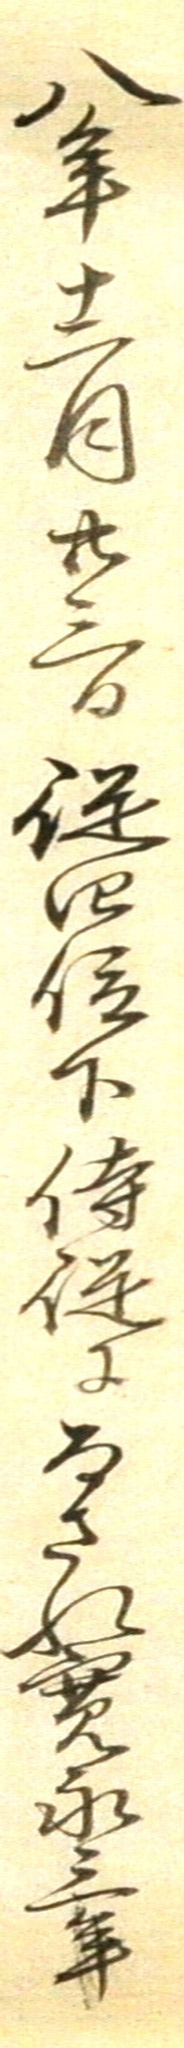八年十二月廿三日従四位下侍従になされ寛永三年
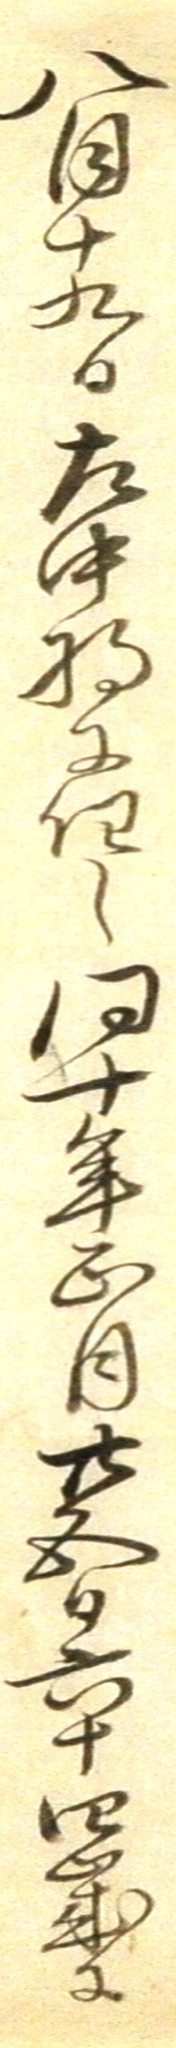八月十九日左中将に任し同十年正月廿五日六十四歳に
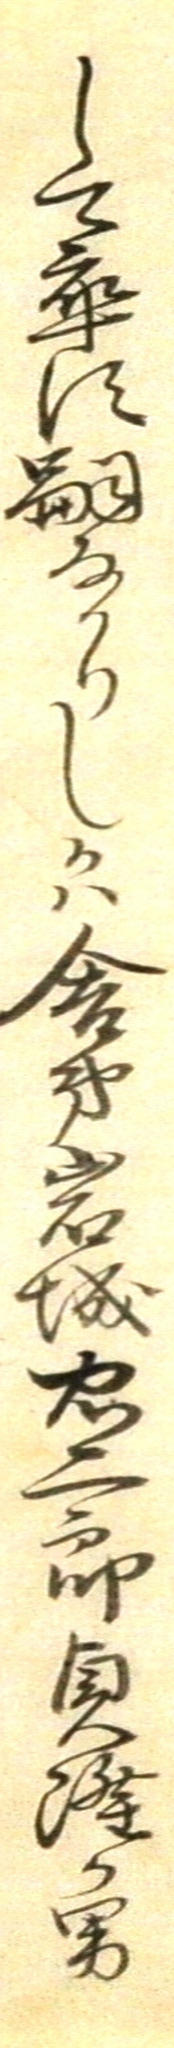して卒す嗣なかりしかは舎弟岩城忠二郎貞隆か男
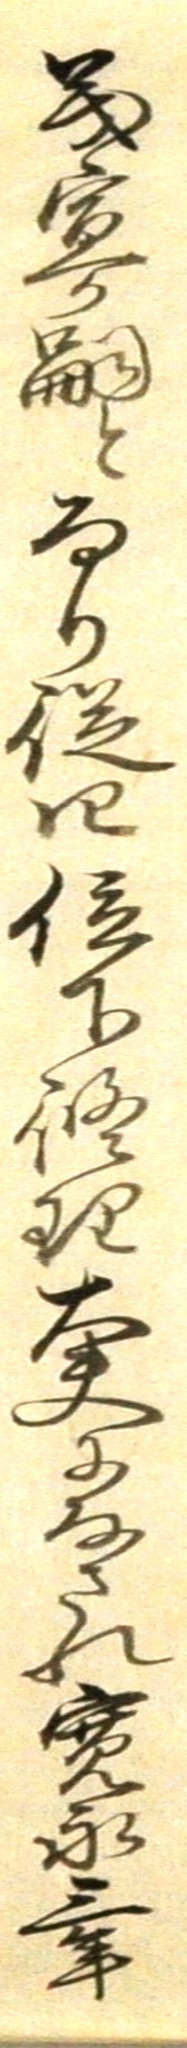義宣か嗣となり従四位下修理大夫になされ寛永三年
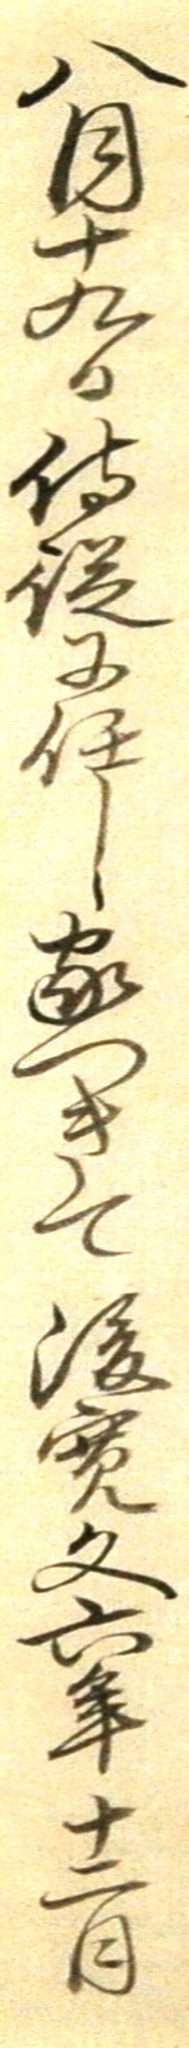八月十九日侍従に任し家つきて後寛文六年十二月
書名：藩翰譜（八・下）
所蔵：伊那市立高遠町図書館・合同会社AMANE
